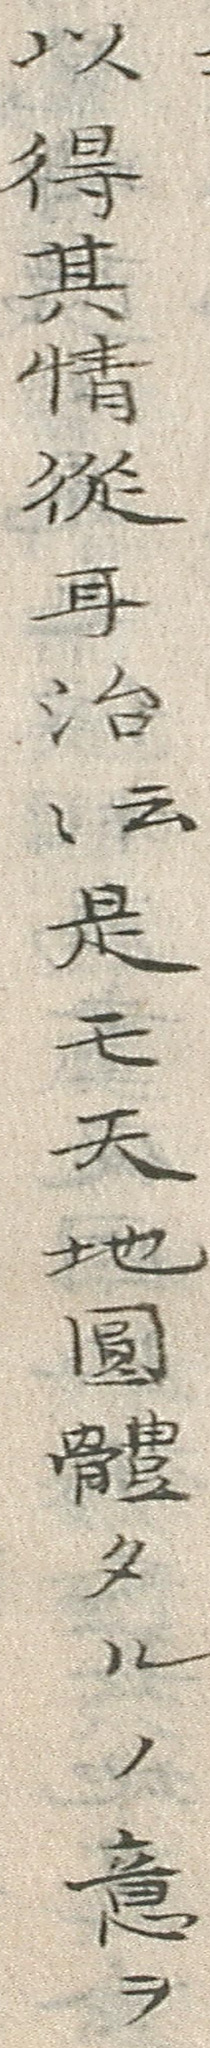以得其情従耳治云〻是モ天地円体タルノ意ヲ
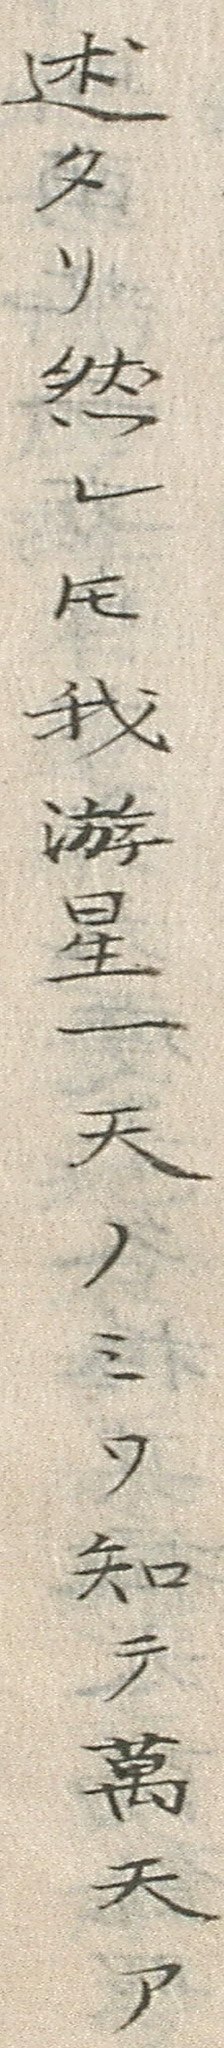述タリ然レトモ我游星一天ノミワ知テ万天ア
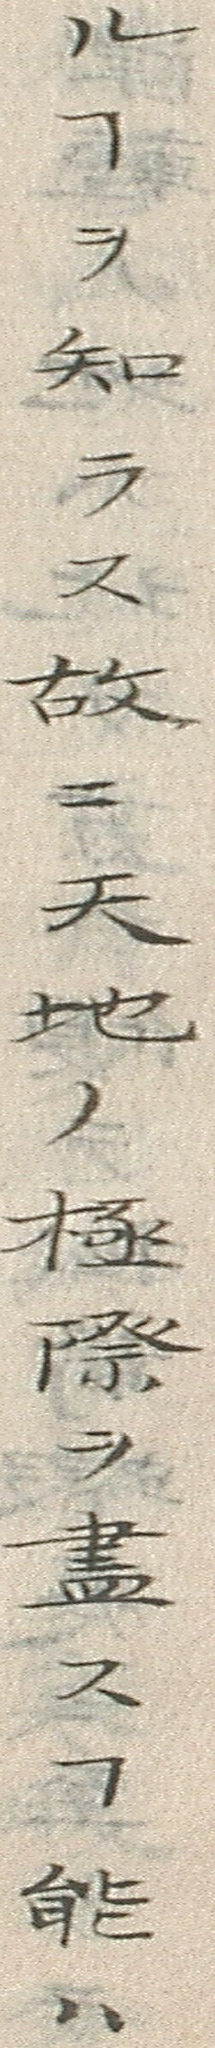ルコトヲ知ラス故ニ天地ノ極際ヲ尽スコト能ハ
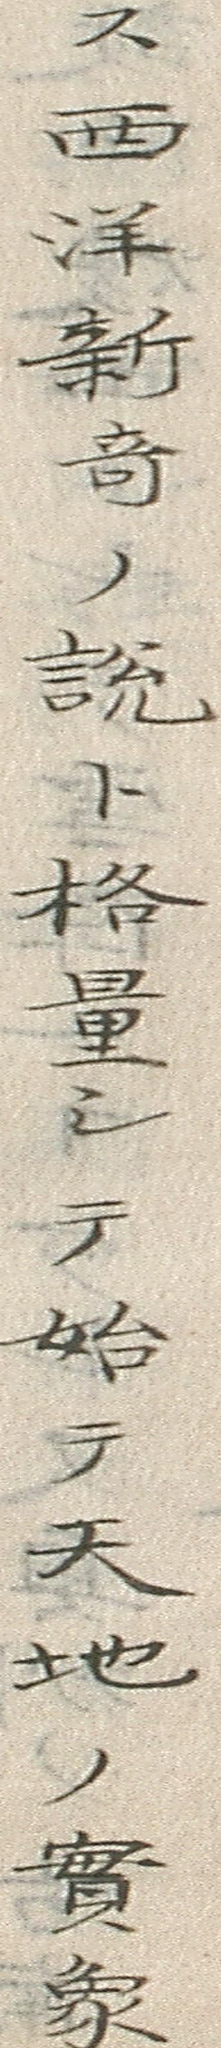ス西洋新奇ノ説ト格量シテ始テ天地ノ実象
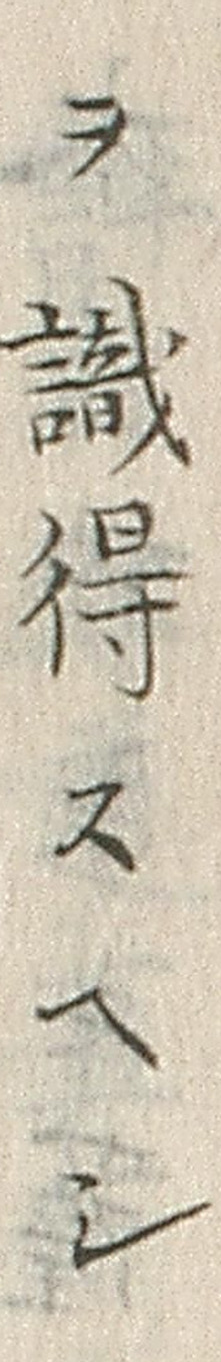ヲ識得スヘシ
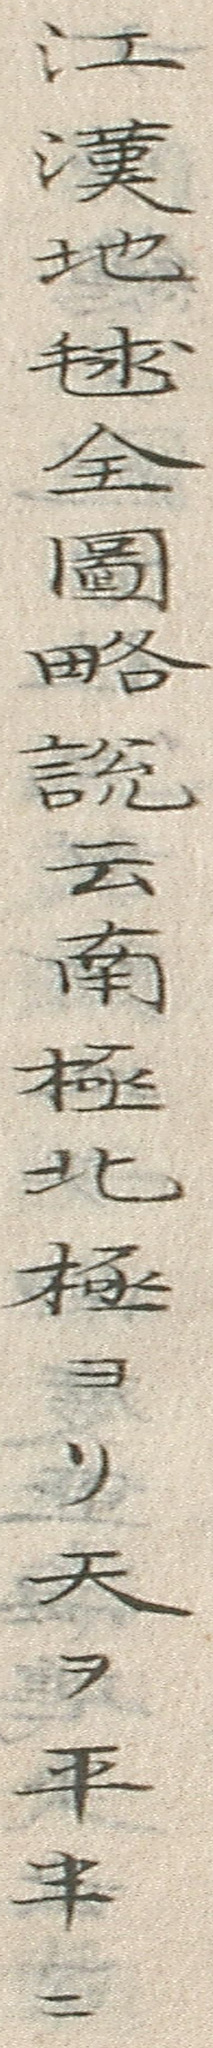江漢地毬全図略説云南極北極ヨリ天ヲ平半ニ
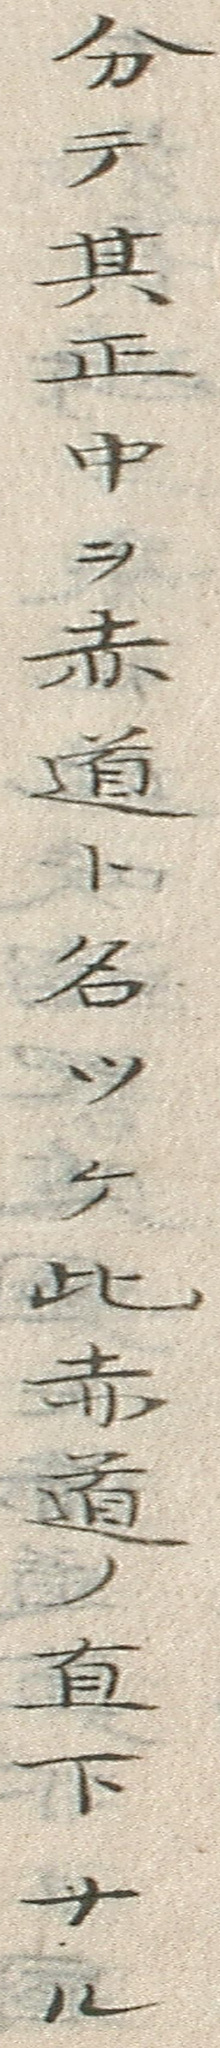分テ其正中ヲ赤道ト名ツケ此赤道ノ直下ナル
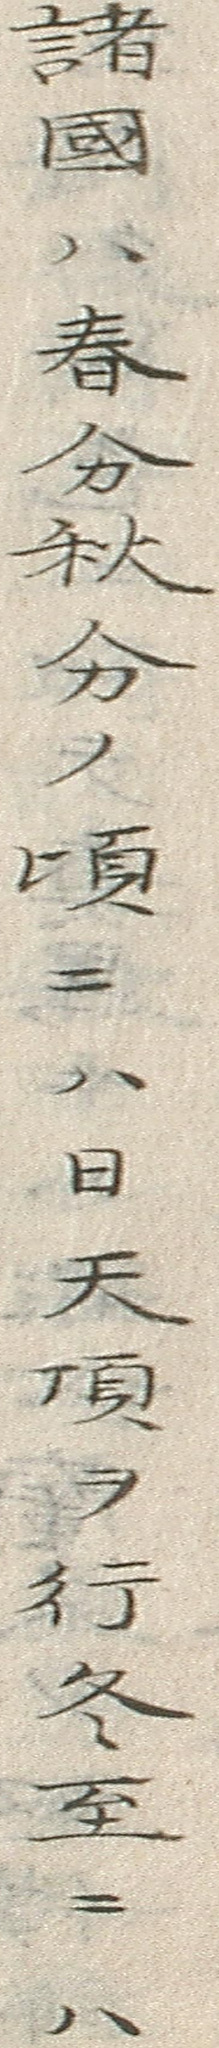諸国ハ春分秋分ノ頃ニハ日天頂ヲ行冬至ニハ
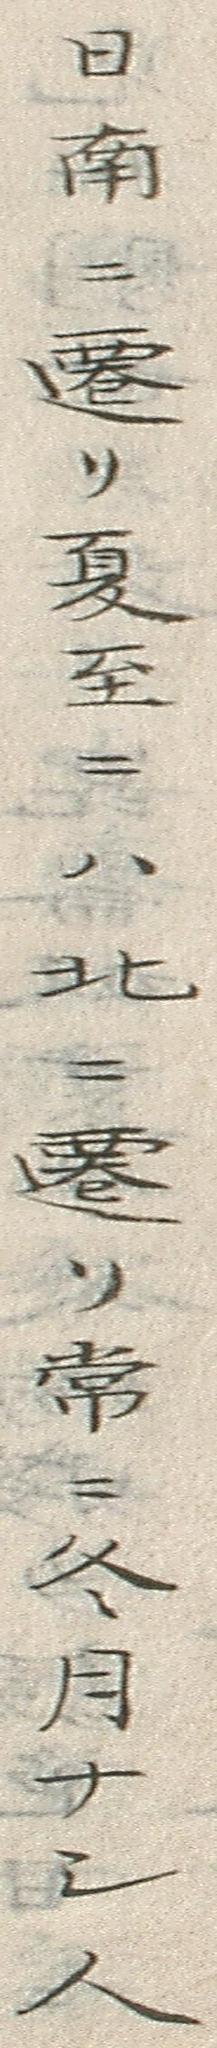日南ニ遷リ夏至ニハ北ニ遷リ常ニ冬月ナシ人
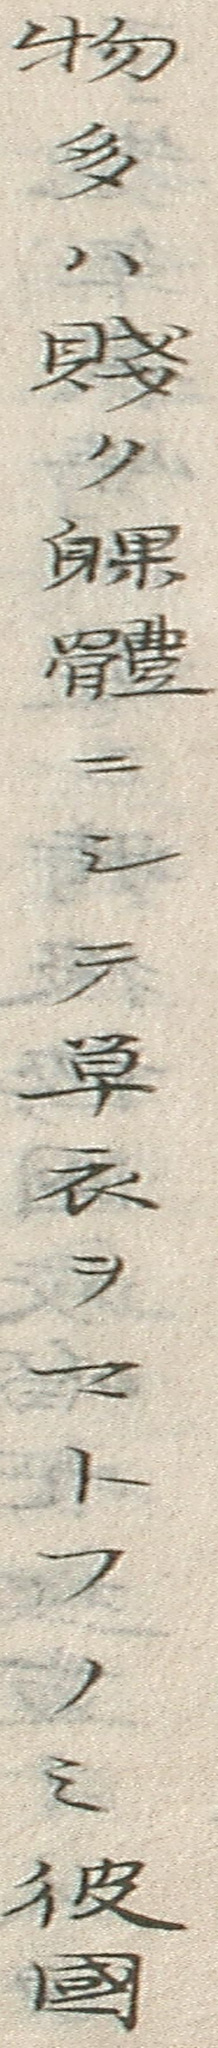物多ハ賤リ裸体ニシテ草衣ヲマトフノミ彼国
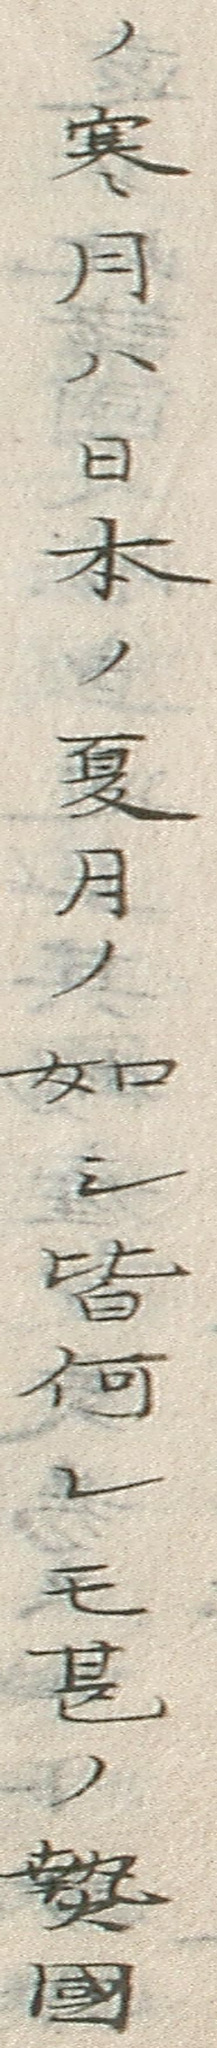ノ寒月ハ日本ノ夏月ノ如シ皆何レモ甚ノ熱国
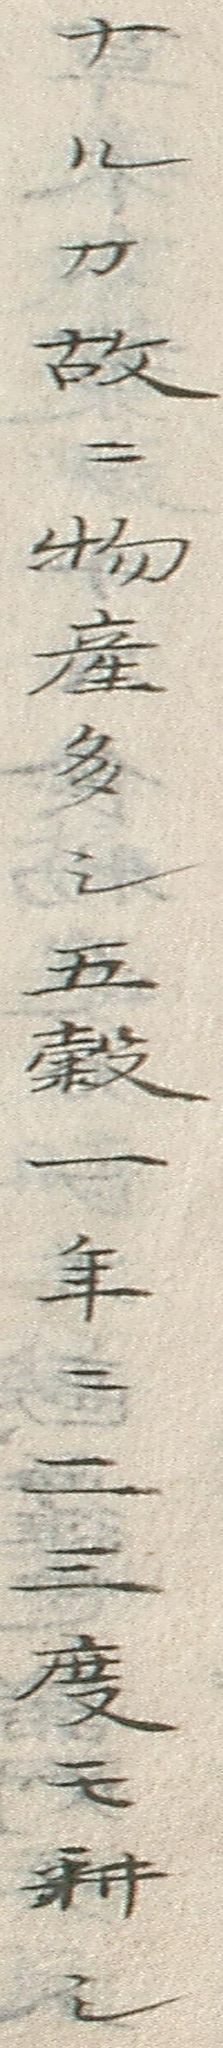ナルカ故ニ物産多シ五穀一年ニ二三度モ耕シ

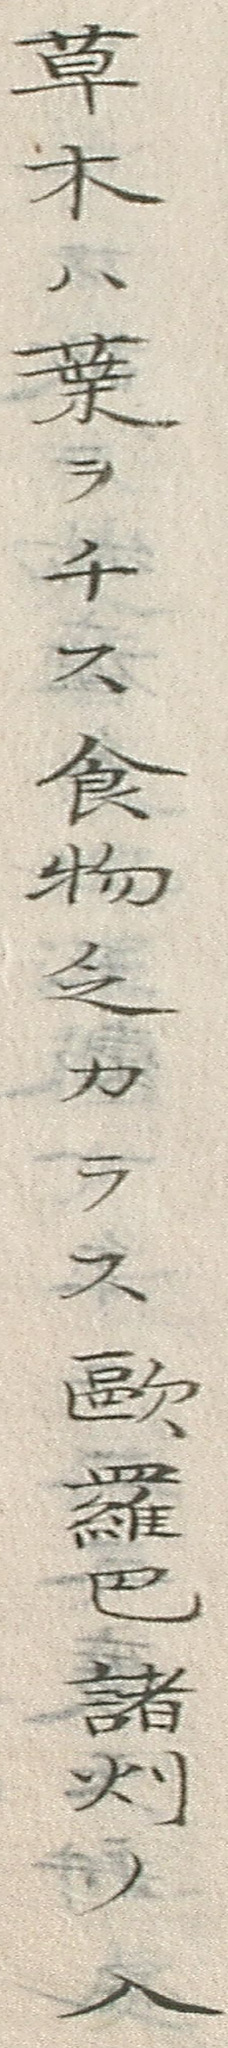草木ハ葉ヲチス食物乏カラス欧羅巴諸灲ノ入
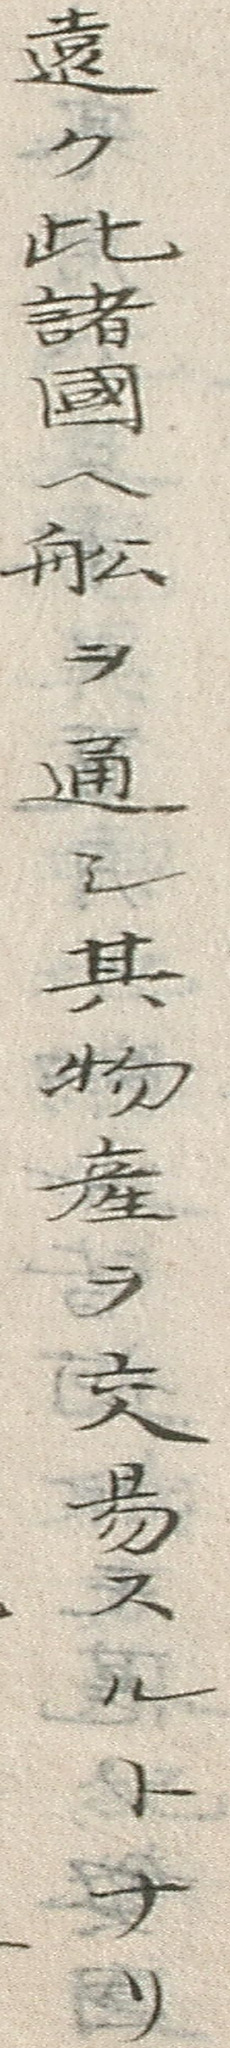遠ク此諸国ヘ船ヲ通シ其物産ヲ交易スルトナリ
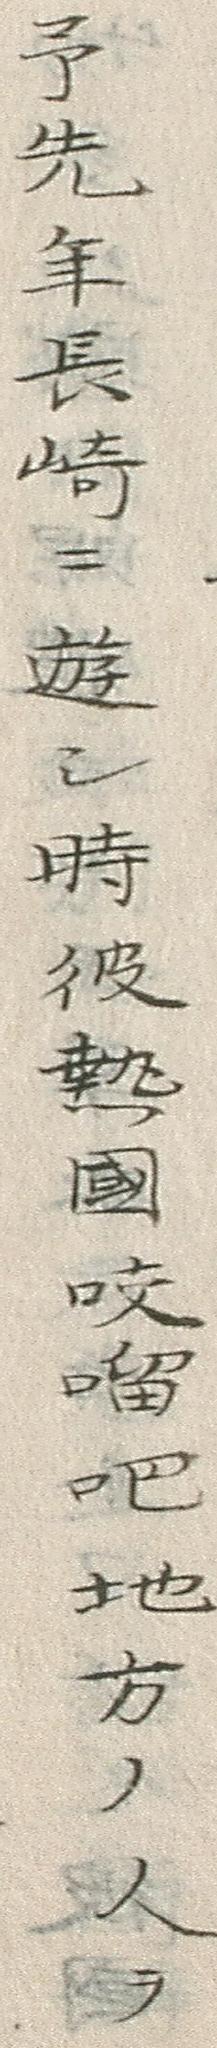予先年長崎ニ遊シ時彼熱国咬𠺕吧地方ノ人ヲ
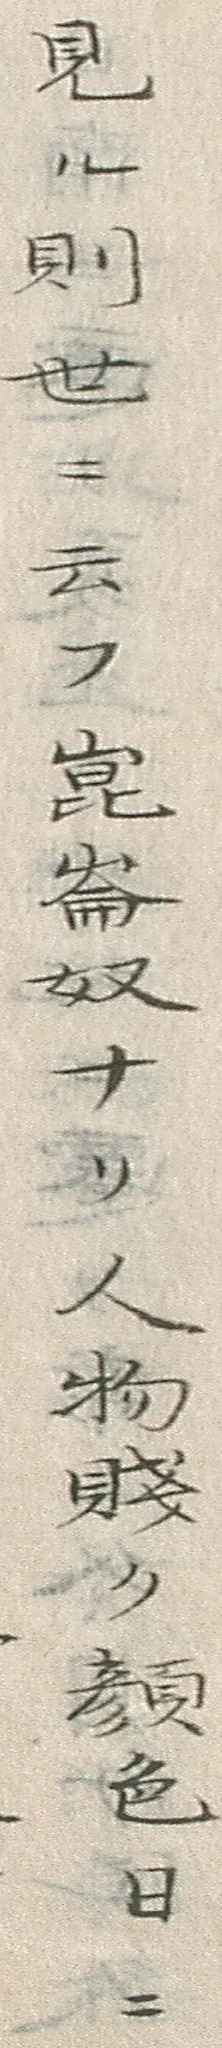見ル則世ニ云フ崑崙奴ナリ人物賤ク顔色日ニ
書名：天學略名目羽翼　全
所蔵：東京大学地震研究所図書室 Earthquake Research Institute Library, The University of Tokyo, JAPAN
